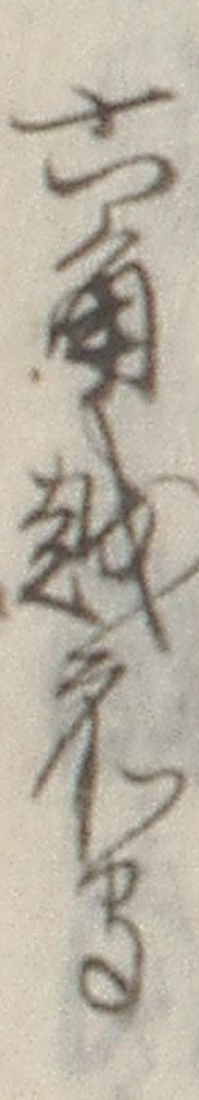宣旨六角越前守

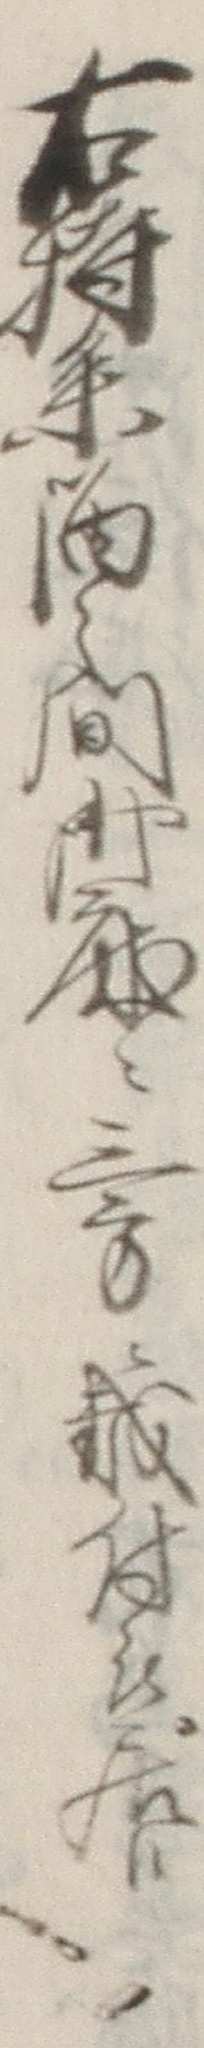右持参溜の間御床ニ三方ニ載付罷居候
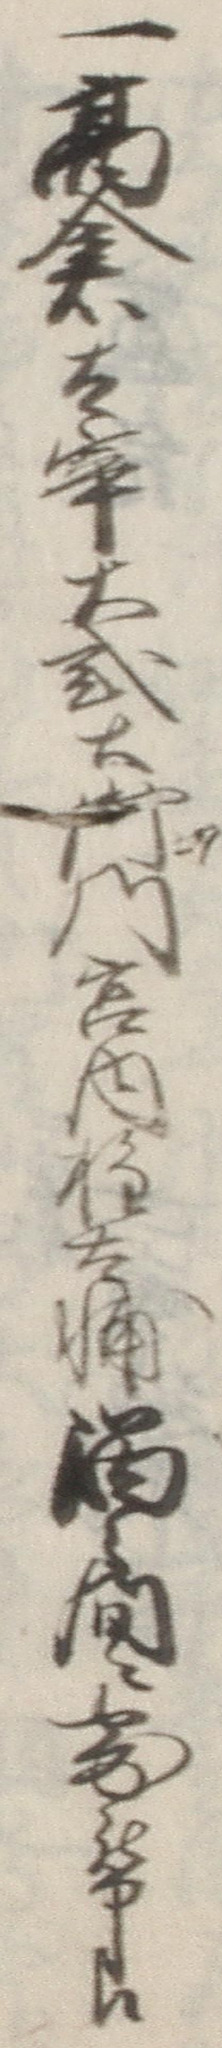一高倉太宰大弐御門宮内権大輔溜之間ニ寄罷申候
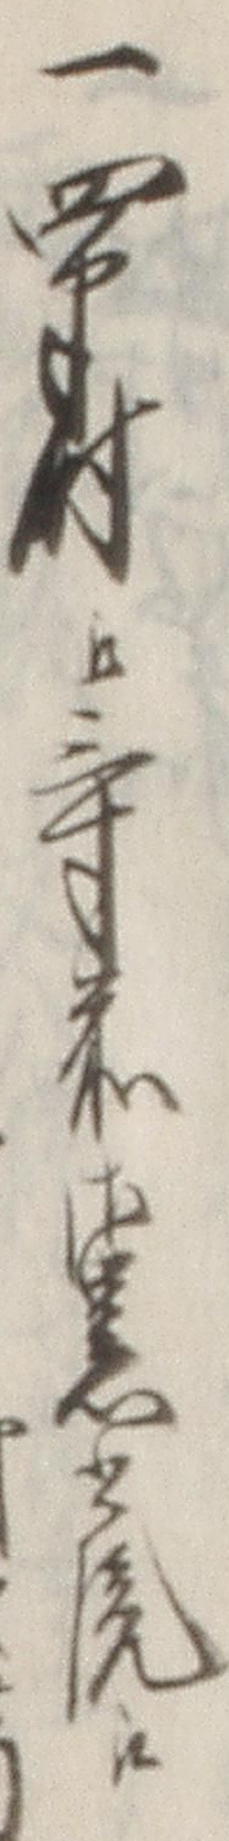一四半時江三寸前御黒書院え
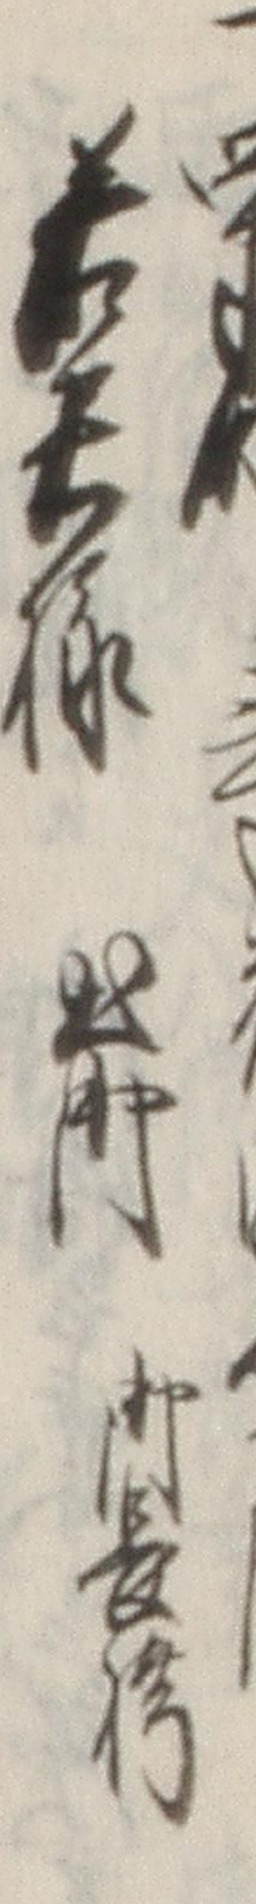若君様出御御長袴
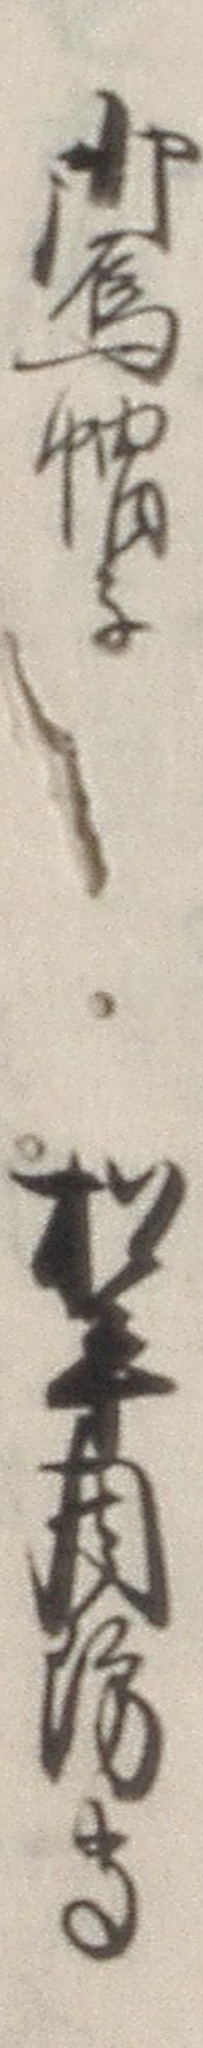御烏帽子松平周防守
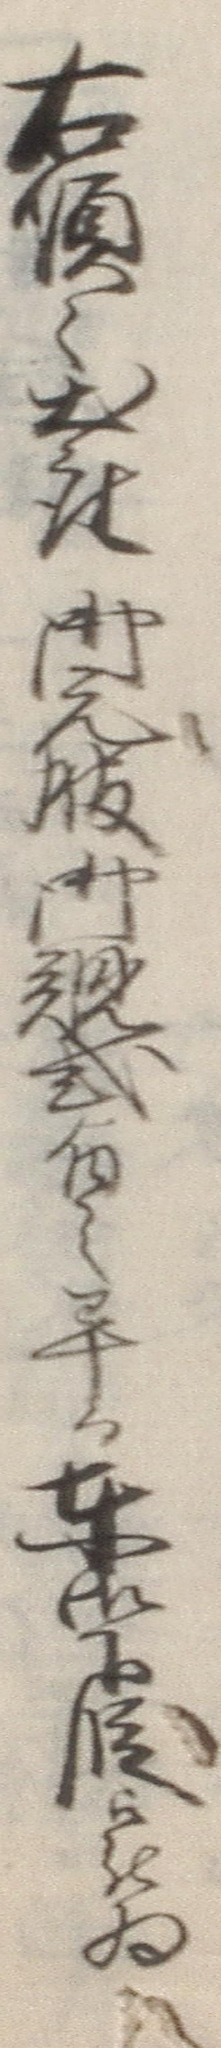右順々出座御元服御規式有之畢而東御下段え被為
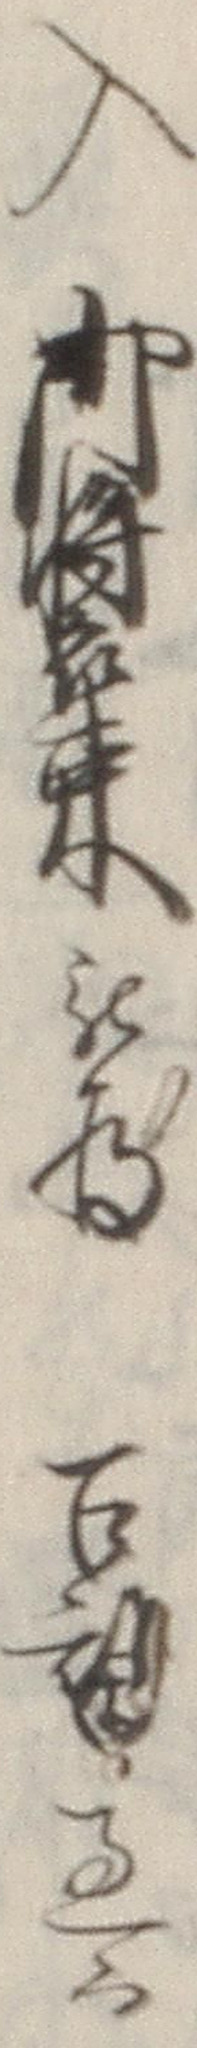入御装束被為召替過而
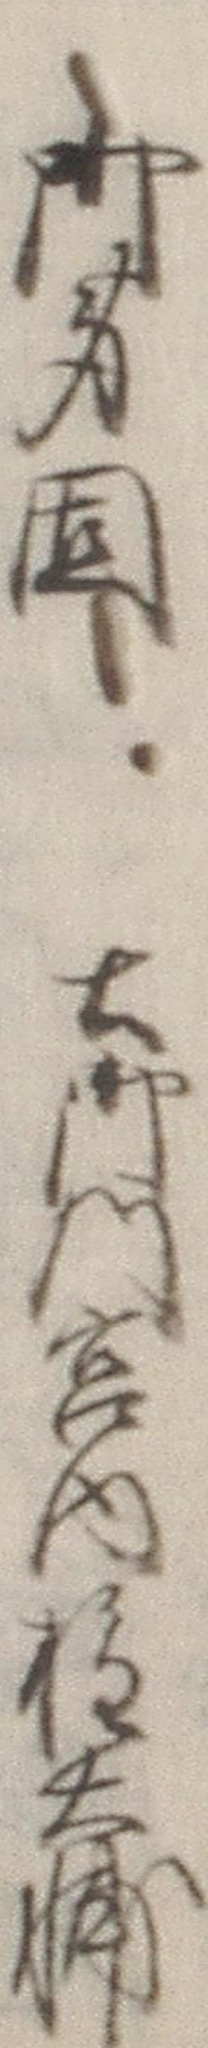御身固土御門宮内権大輔
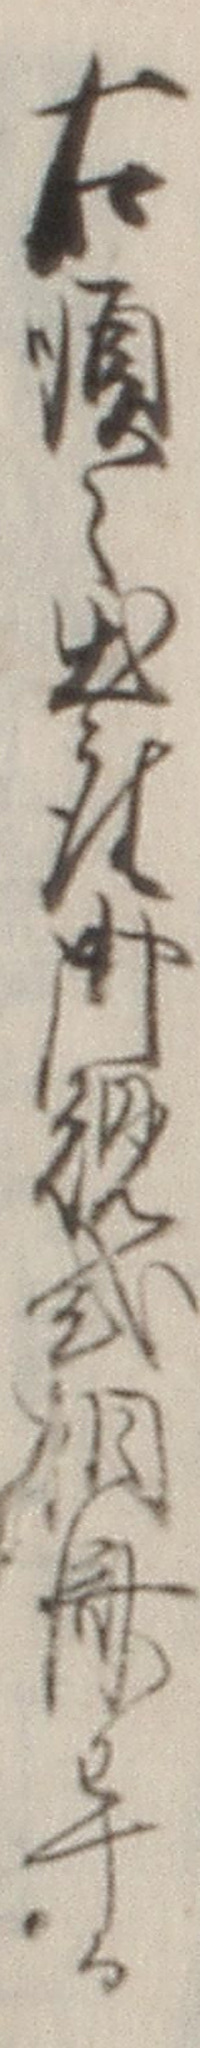右順々出座御規式相済畢而
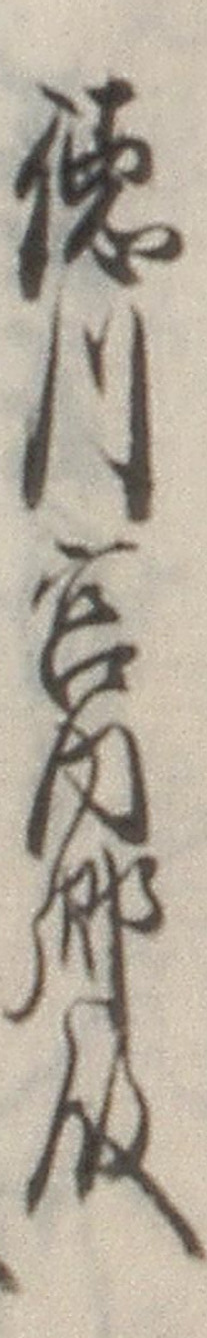徳川宮内卿殿
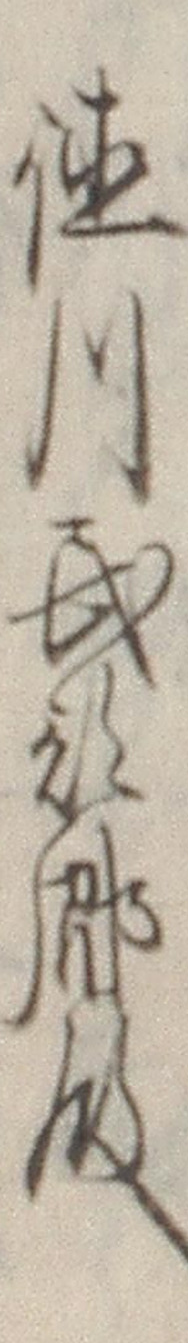徳川民部卿殿
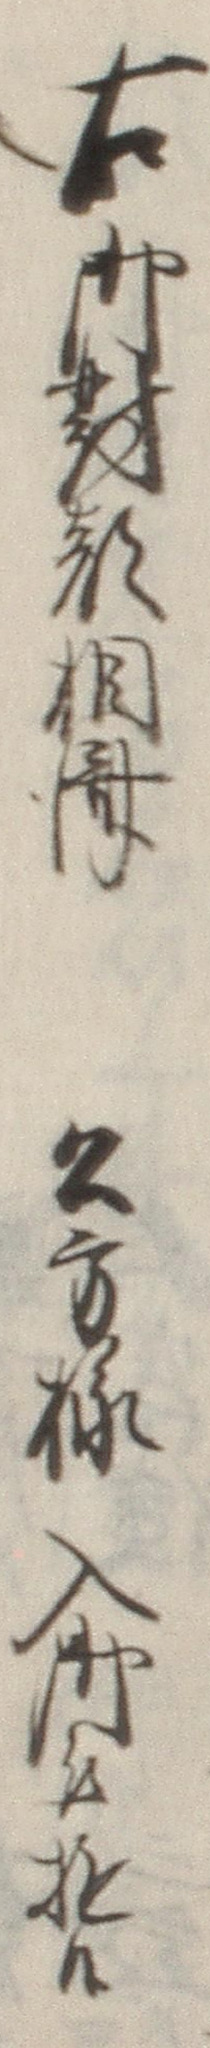右御対顔相済公方様入御被遊候
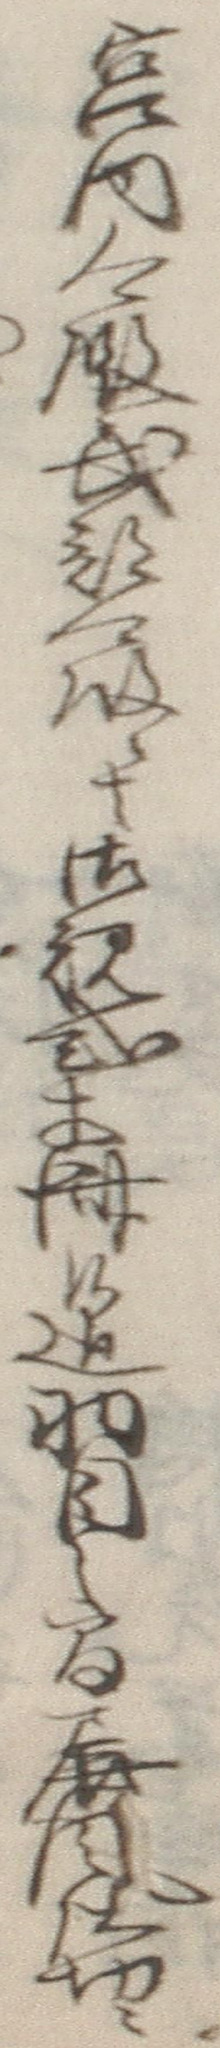宮内卿殿民部卿殿御規式相済候迄羽目の間屛風仕切ニ
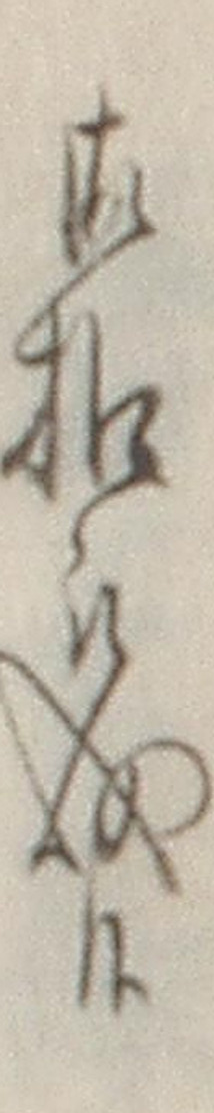御扣被成候
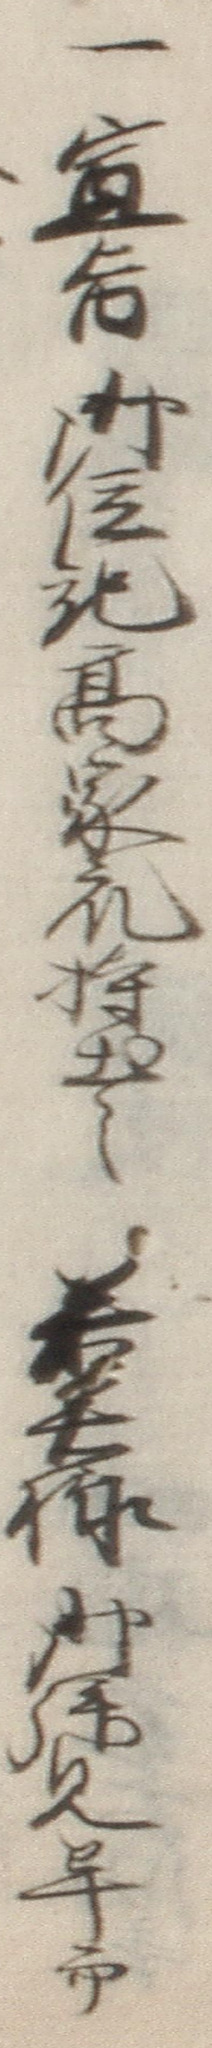一宣旨御位記高家衆持出し若君様御拝見畢而
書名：[諸国災害記録]
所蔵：東京大学地震研究所図書室 Earthquake Research Institute Library, The University of Tokyo, JAPAN
